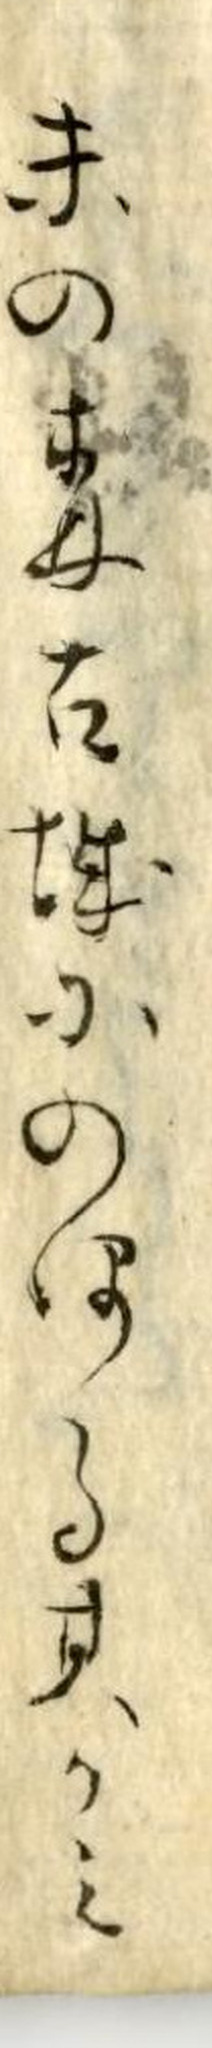未の森古城にのほる其かみ
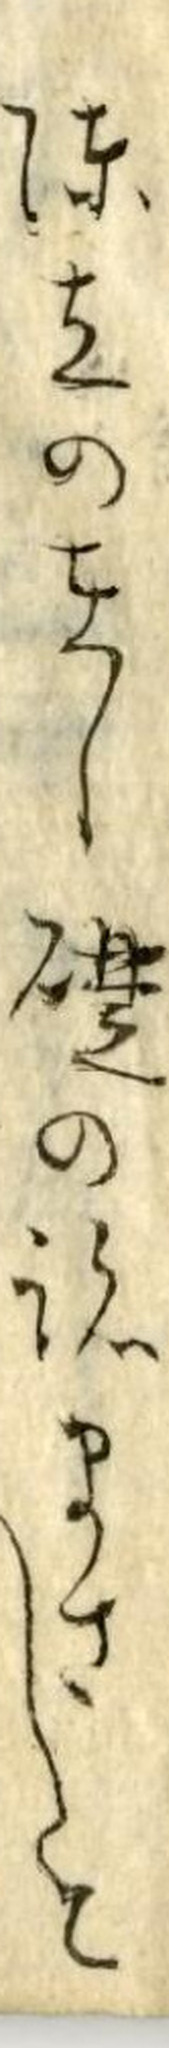陳立の在し礎の跡まさ
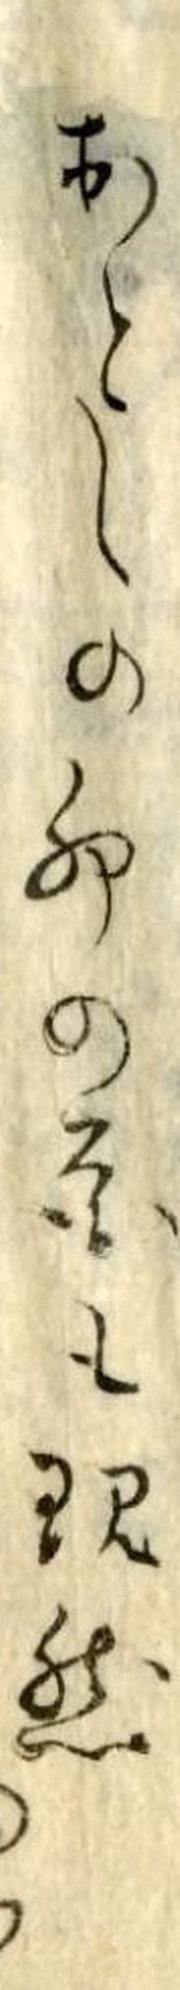おとしの卯の花も現然
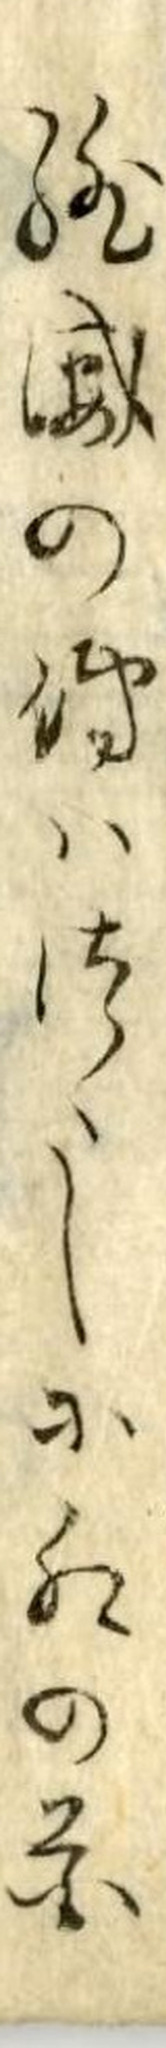緋威の俤はつゝしに卯の花
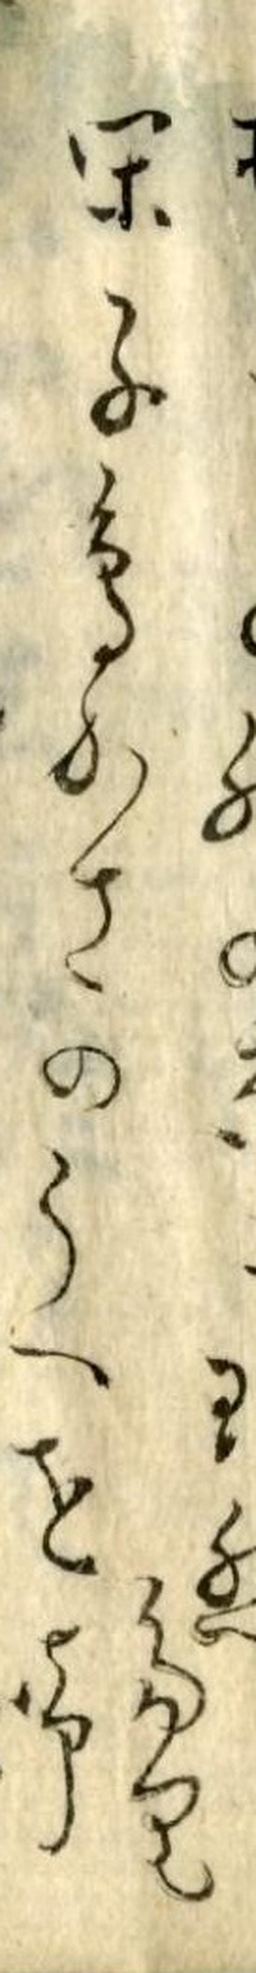閑子鳥かさのうへを啼
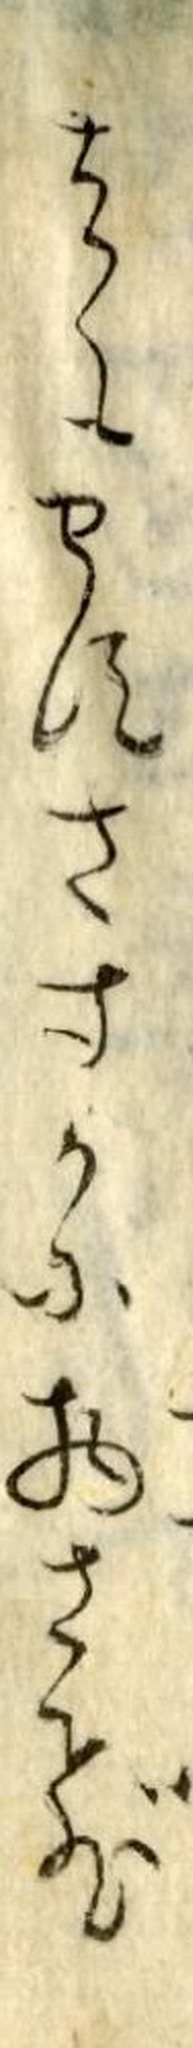去もせすさすかに物さひ
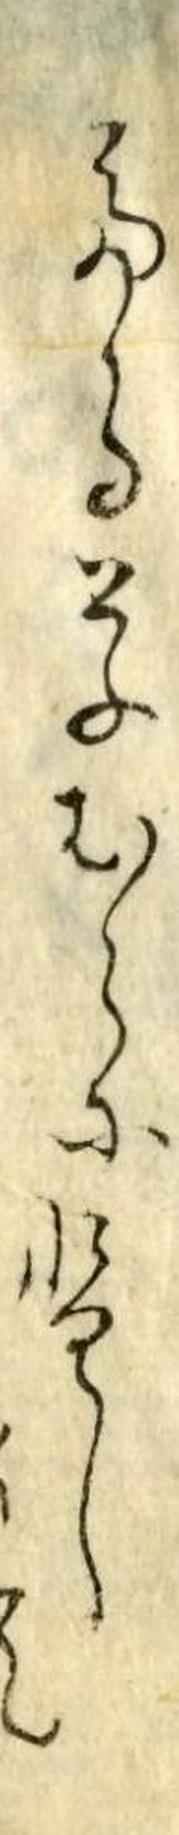たる草むらに暫し
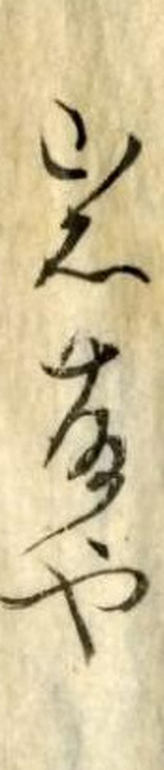岩藤や
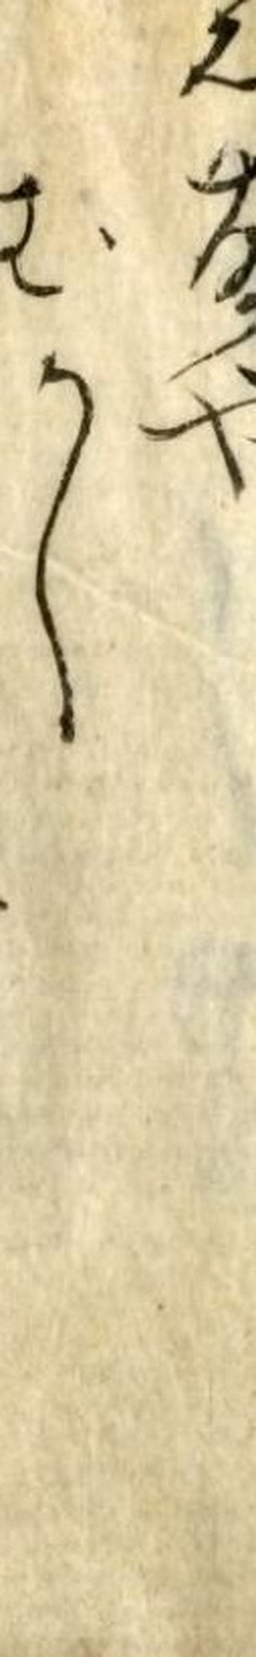むかし
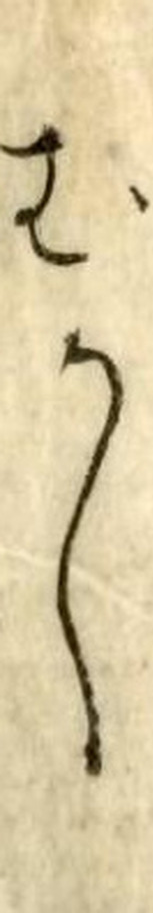むかし
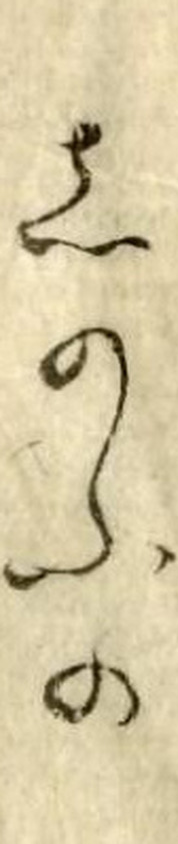しのふの

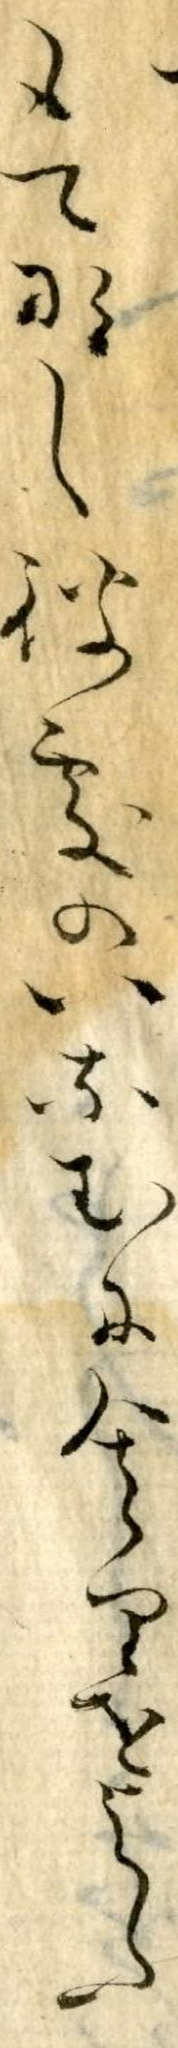もてなし彼処のいなむに舎りをよふ
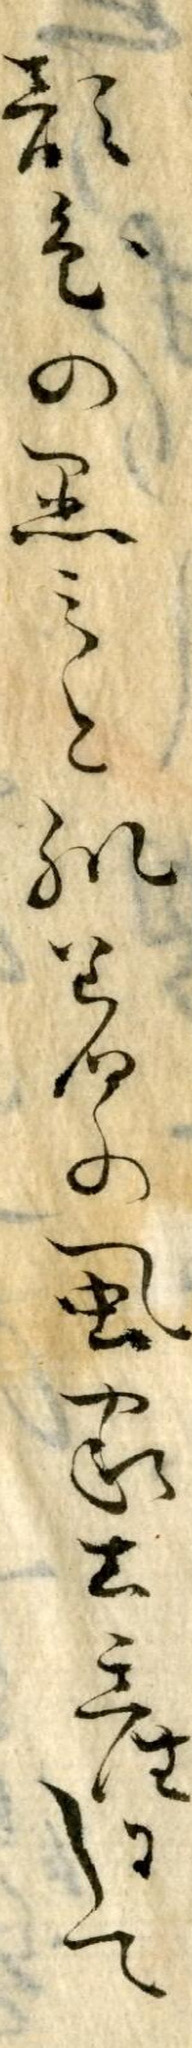顔色の黒みと肌着の虱家土産に
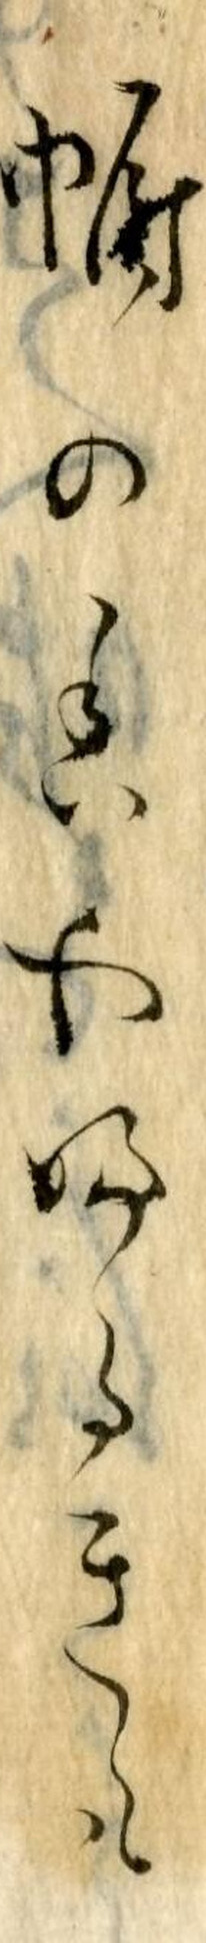幮の香やふるきも
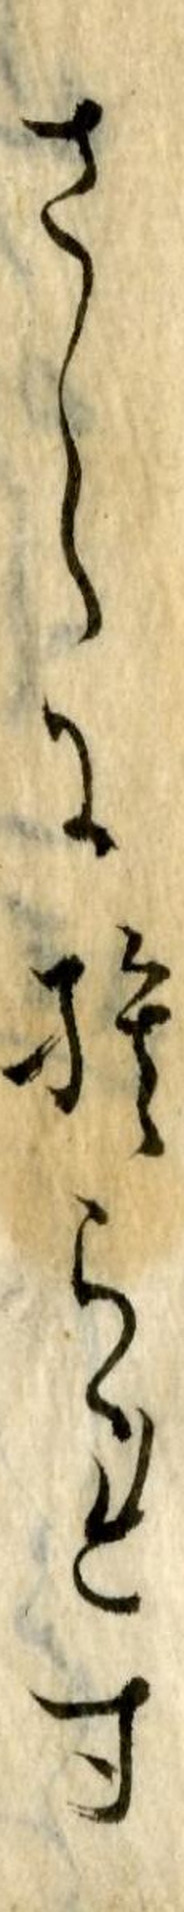さらに捨られす
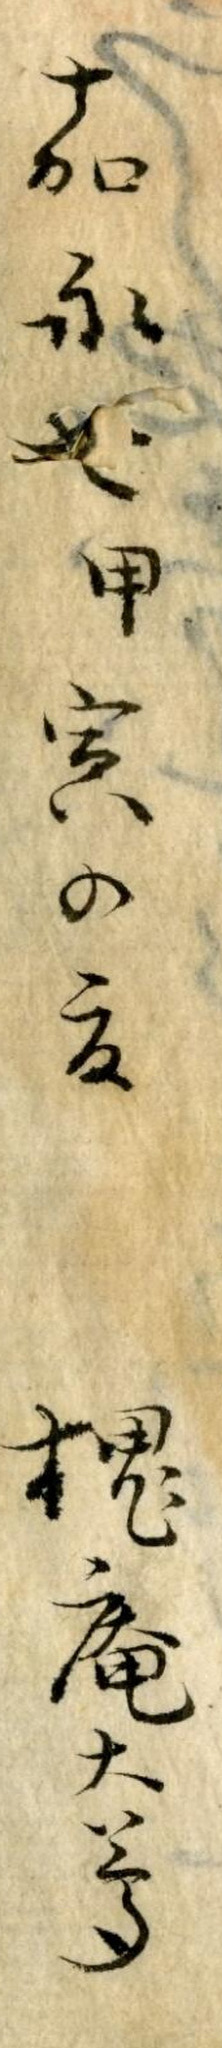嘉永甲寅の夏槐庵大夢
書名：能登めぐり
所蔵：Ishikawa Prefectural Library
